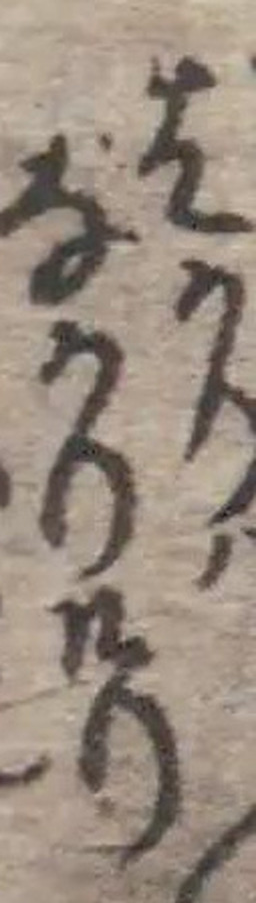なかりけり
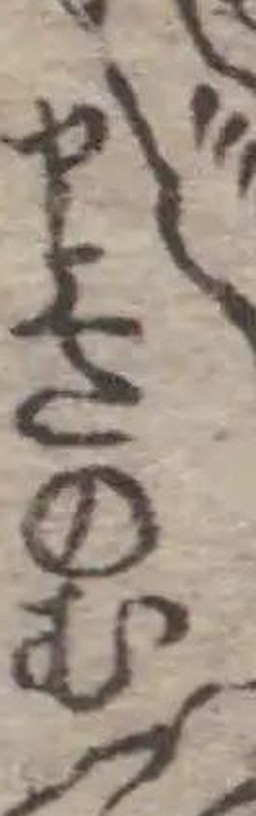申上たのむ
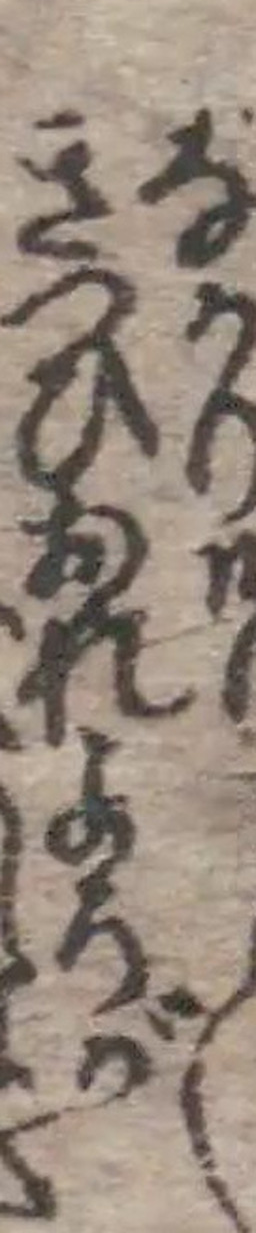きつひおれようが

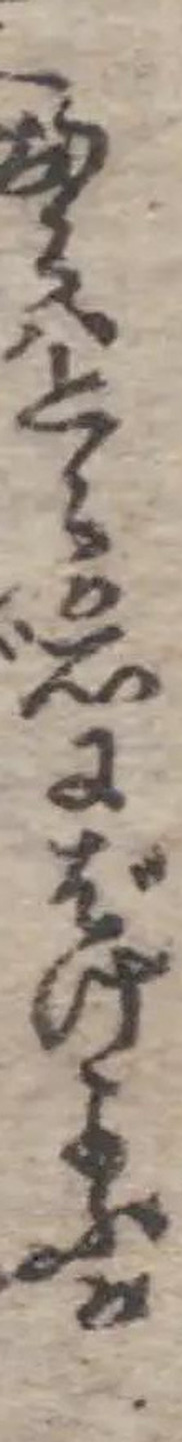おらはとらが石にばけよふか
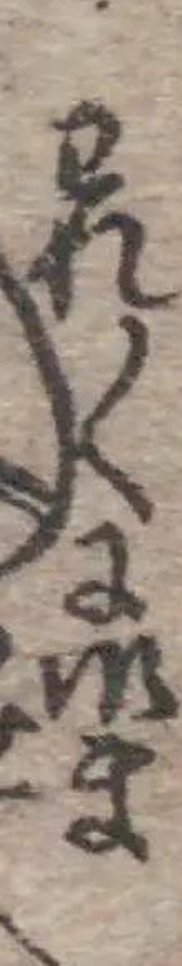われ〳〵に御ま
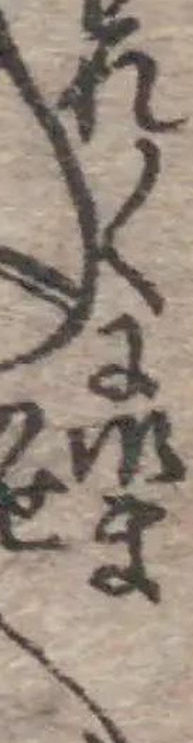われ〳〵に御ま
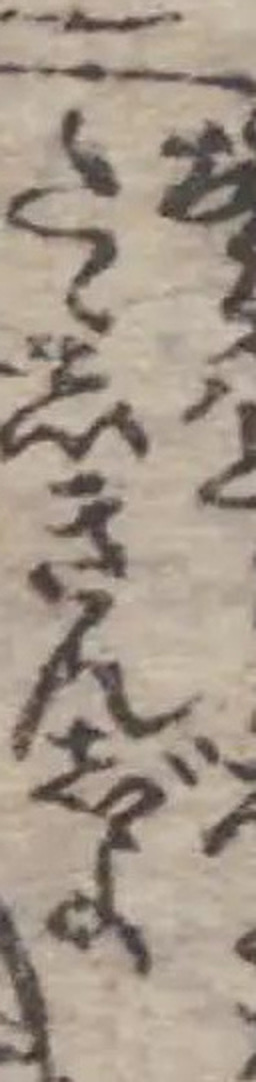たゝしきんじよ
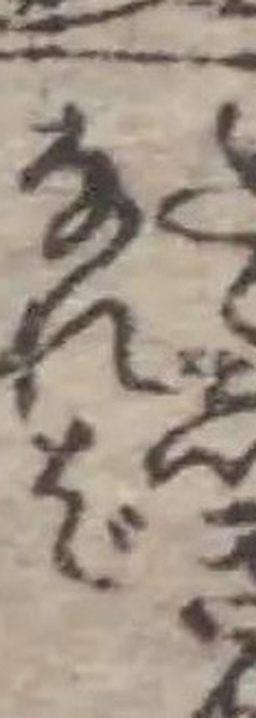なれば
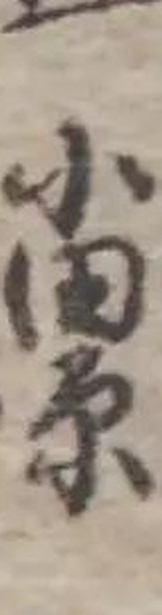小田原
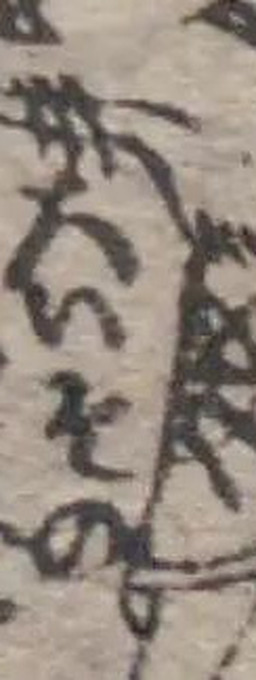大いその
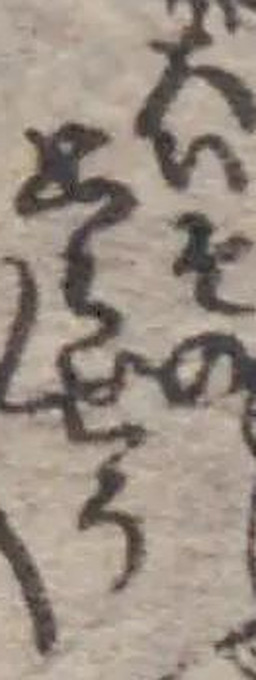とらせう
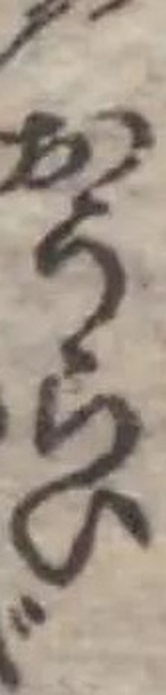おうらい
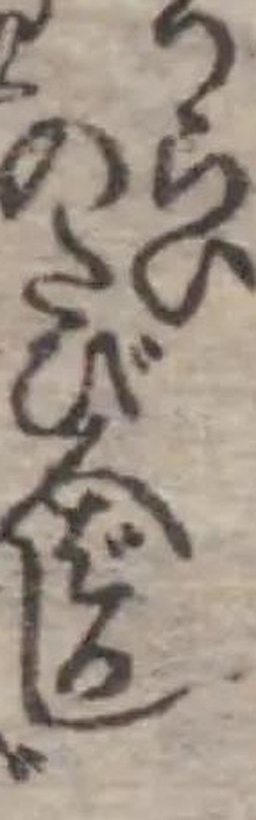のたび人ばかし
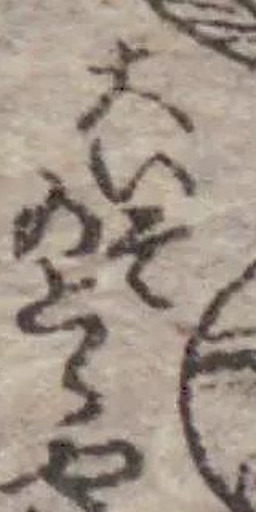大いそ
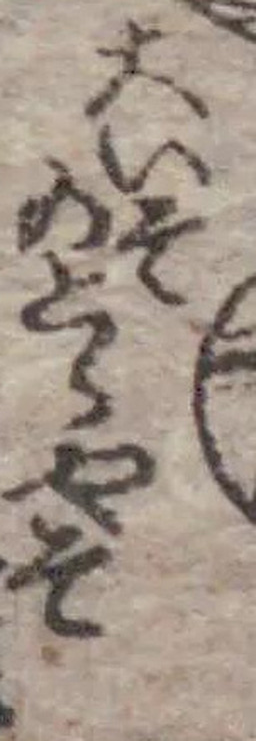のとらやそ
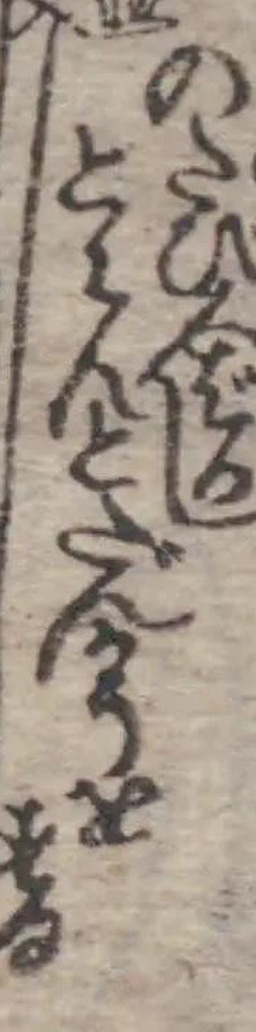とらんとだんかうをする
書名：大磯地蔵咄 2巻
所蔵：国立国会図書館 National Diet Library, JAPAN
